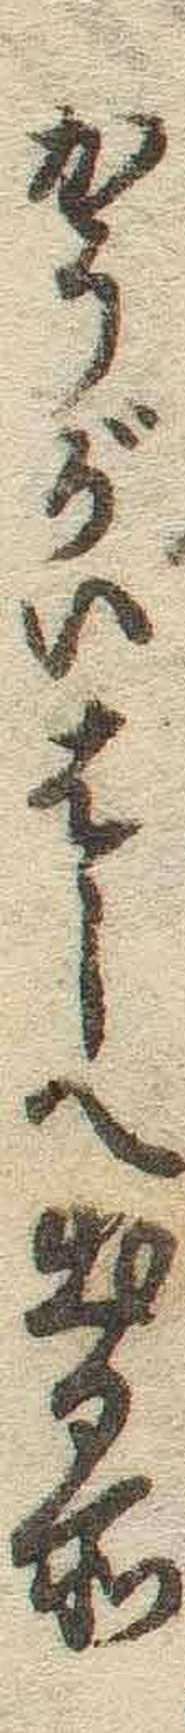かうがいはしへ出る所

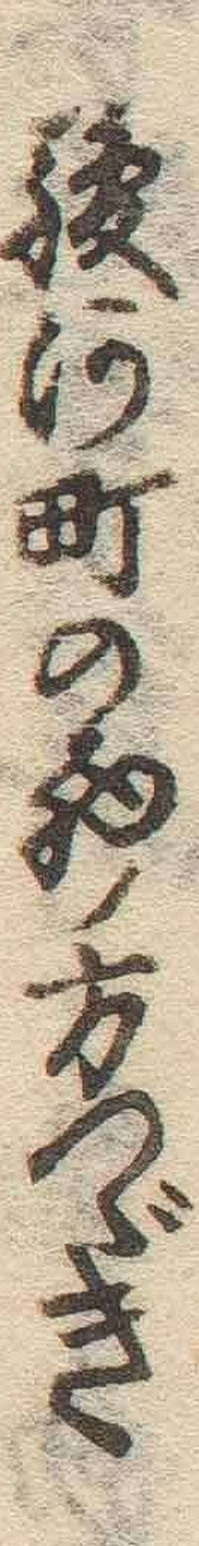駿河町の西ノ方つゞき
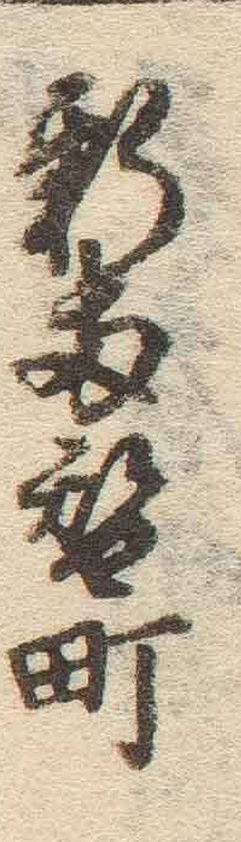本両替町
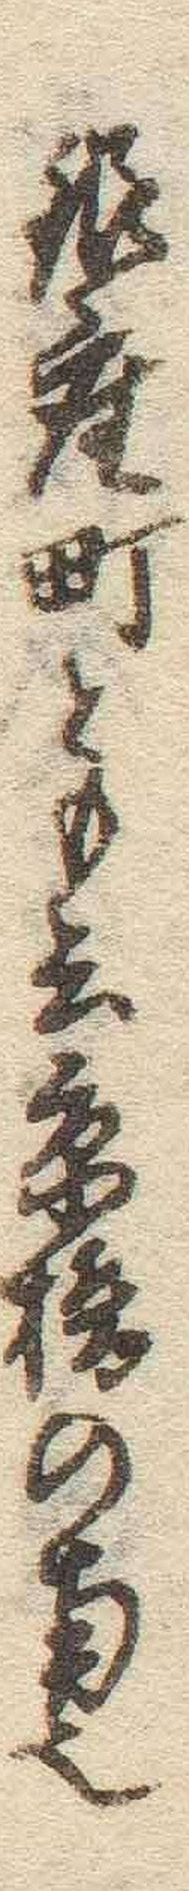銀座町とも云京橋の南也
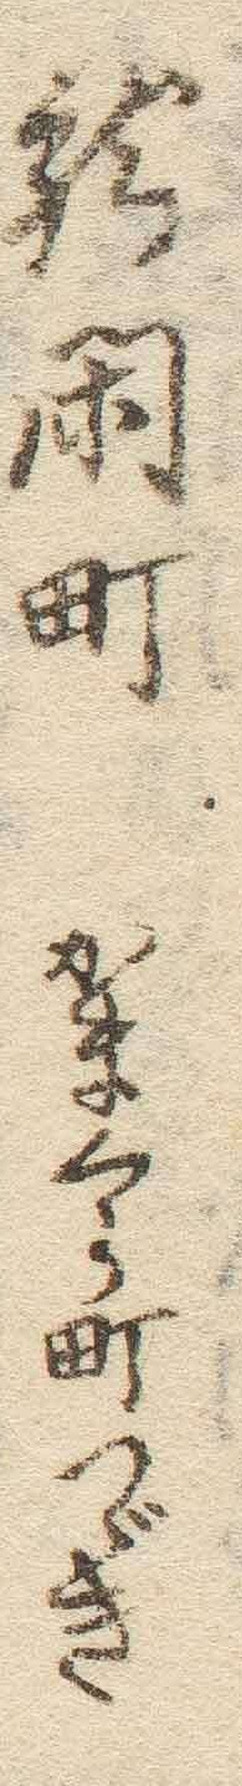龍閑町かまくら町つゞき
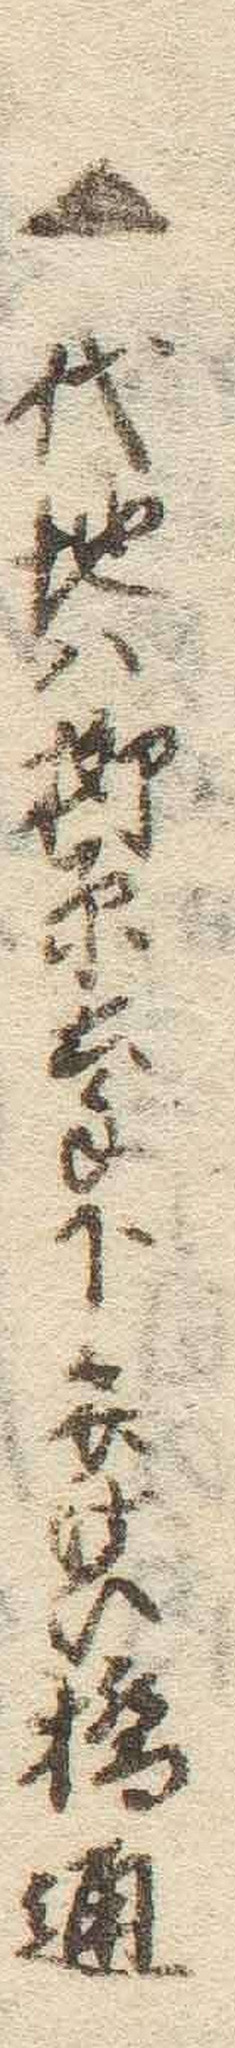▲代地は柳原土手下弁けい橋通
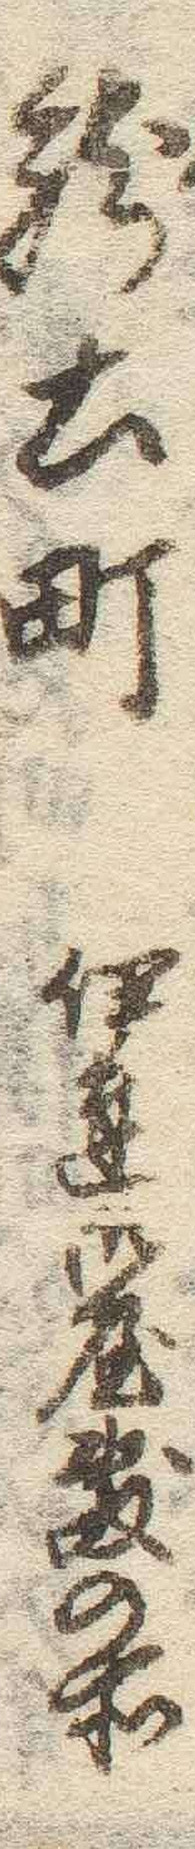龍土町伊達御屋敷の所
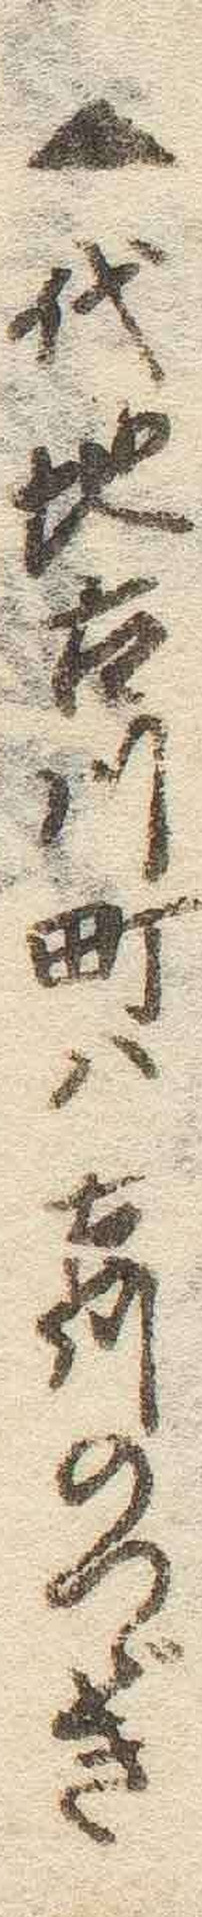▲代地古川町は古川のつゞき
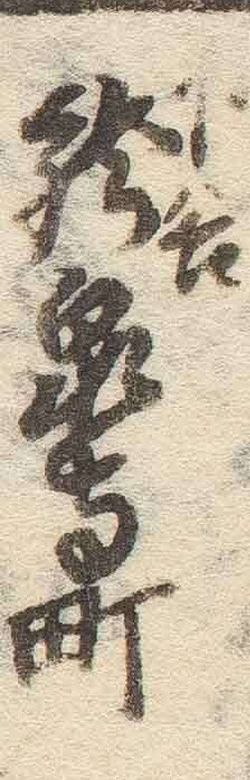龍泉寺町
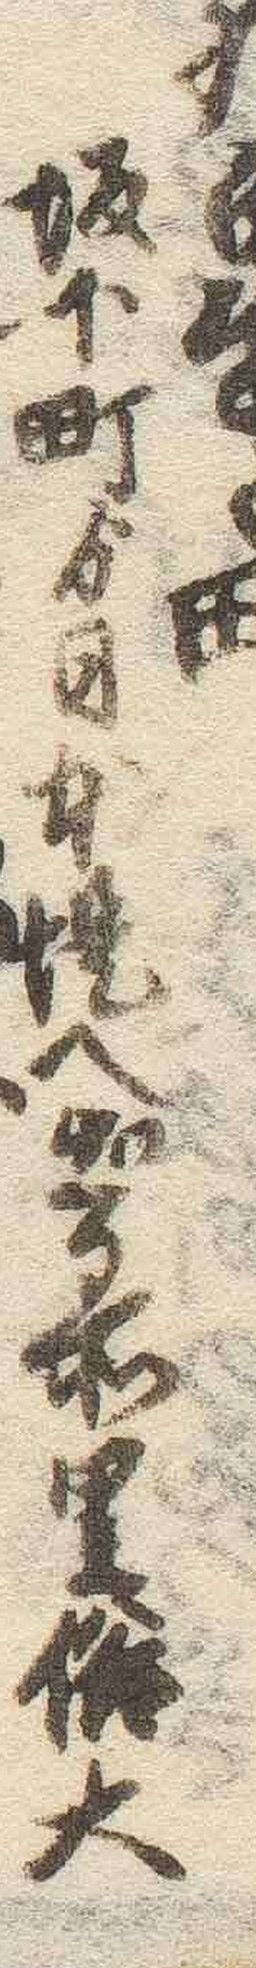坂下町ゟ日本堤へ出る所里俗大
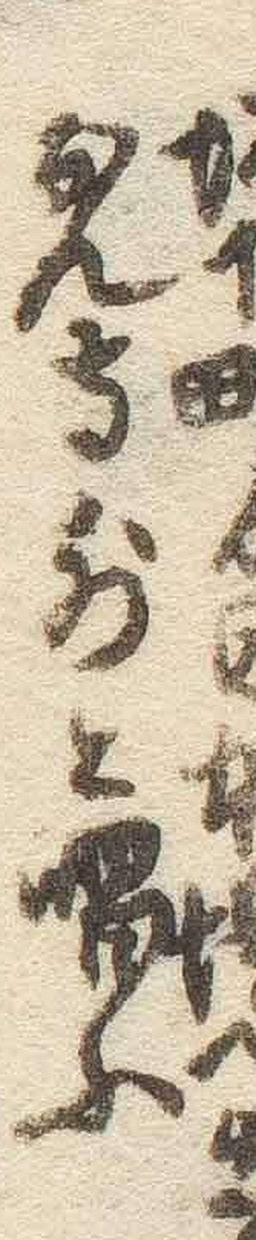おん寺前と唱ふ
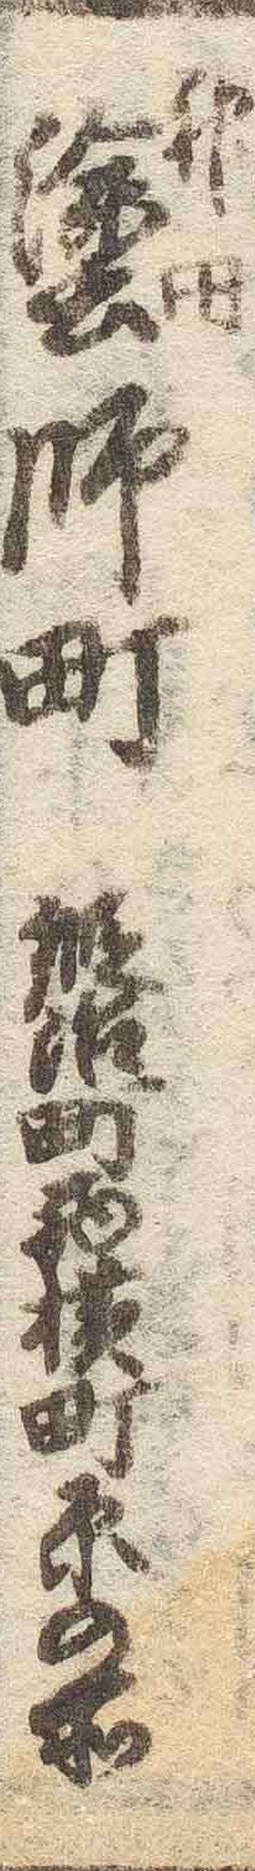塗師町鍛冶町西横町原の所
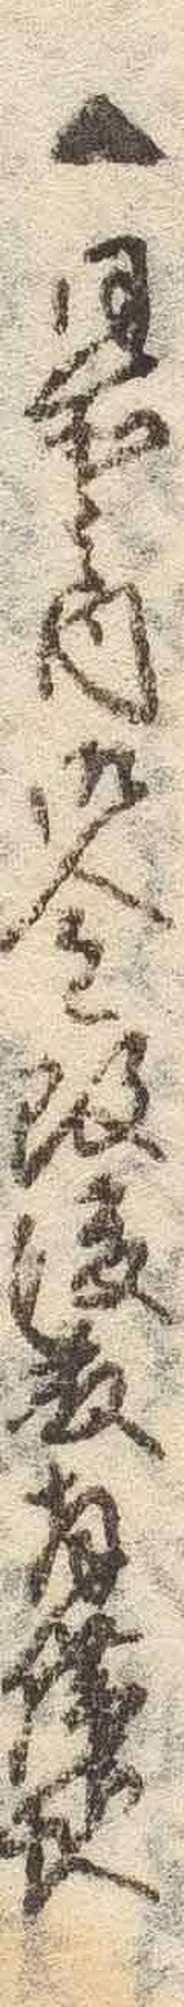▲同所の内御金改後藤拝借地
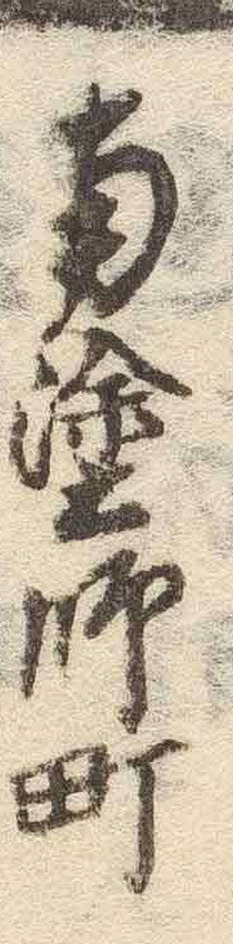南塗師町
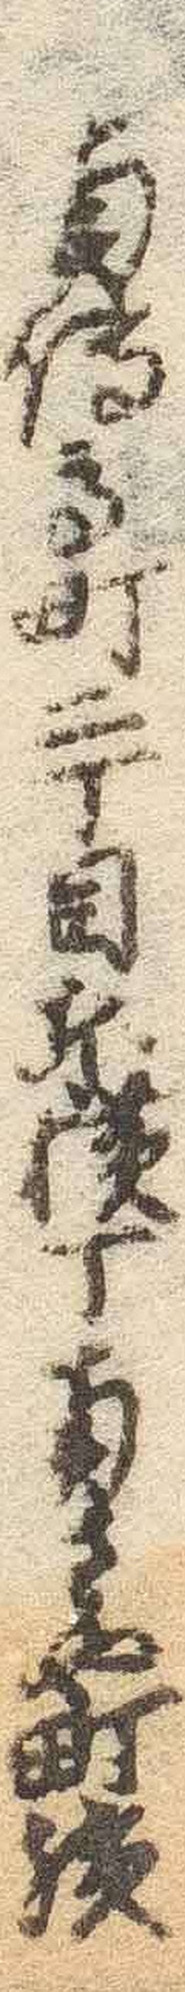南伝馬町二丁目東横丁南さや町続
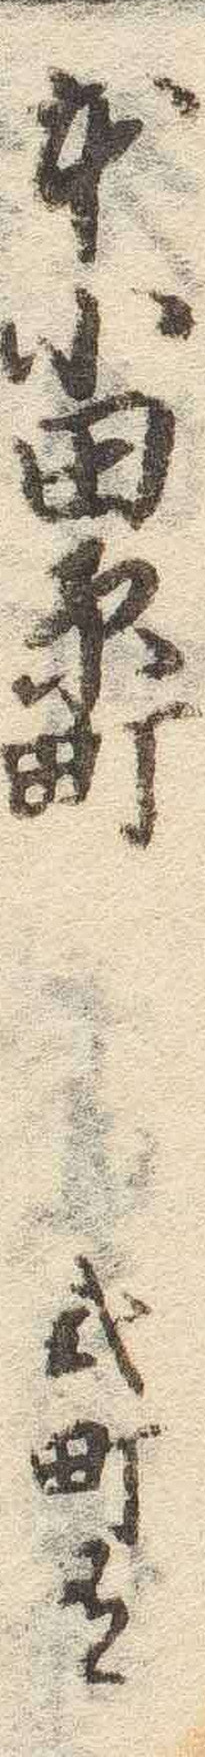本小田原町弐町有
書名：江戸町独案内
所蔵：東京学芸大学附属図書館 国文学研究資料館
